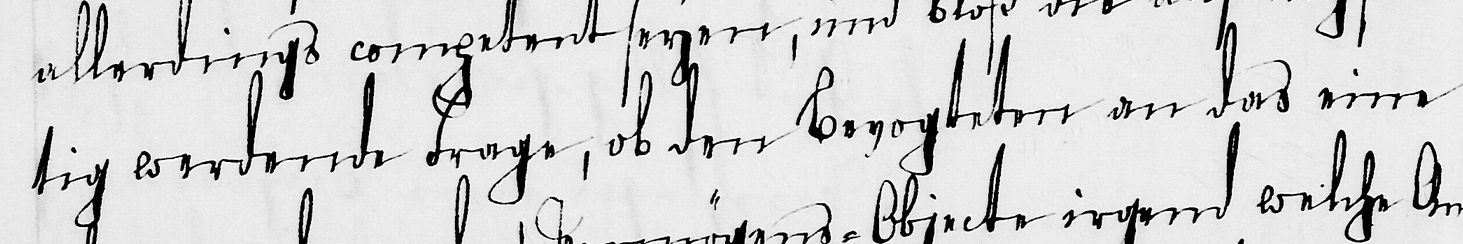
tig werdende Frage, ob den Bevogteten an das eine
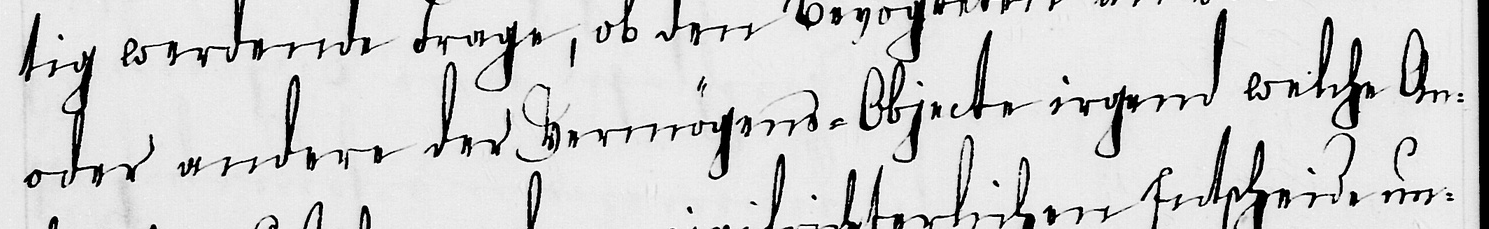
oder andere der Vermögens-Objecte irgend welche An¬
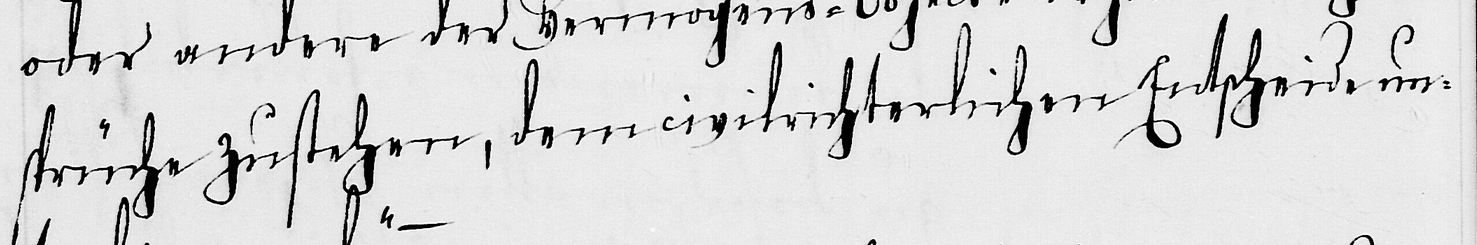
sprüche zustehen, dem civilrichterlichen Entscheide un¬
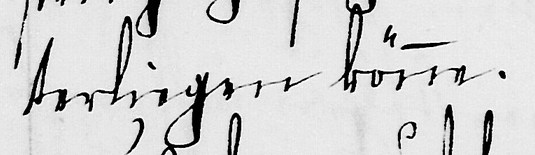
terliegen könne.
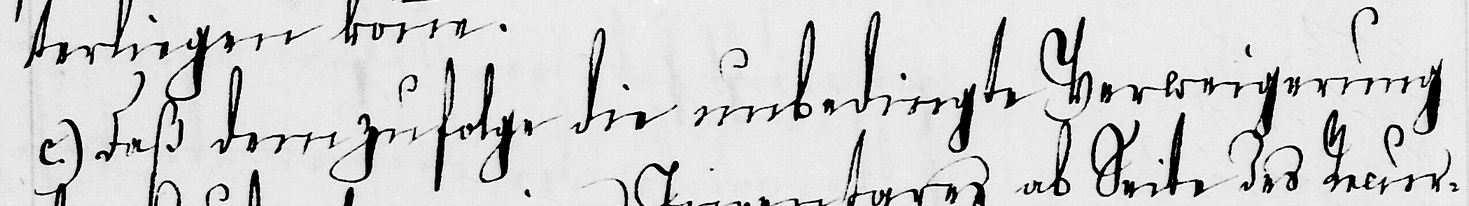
c.) Daß demzufolge die unbedingte Verweigerung
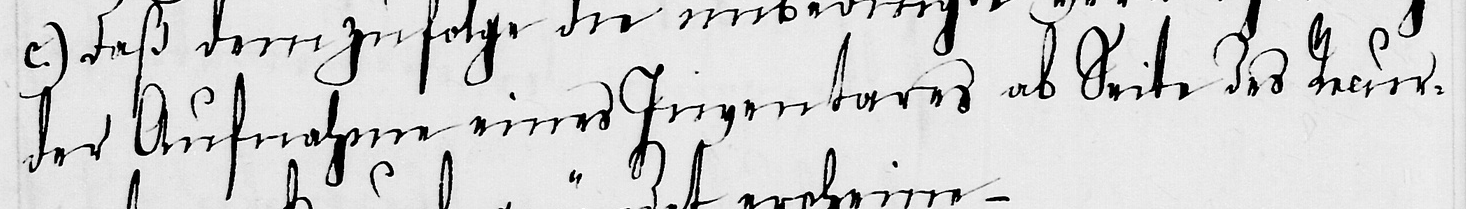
der Aufnahme eines Inventares ab Seite des Recur¬
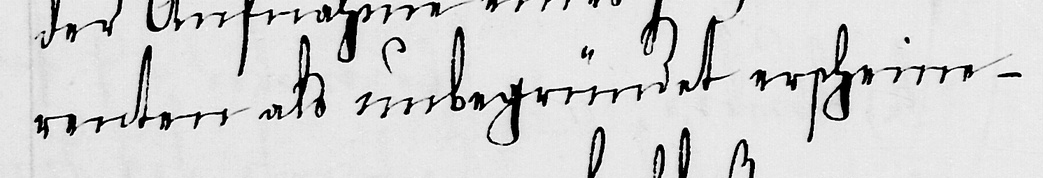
renten als unbegründet erscheine –
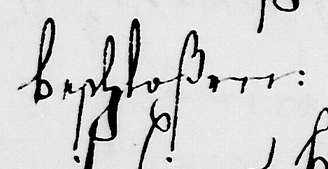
eschloßen:
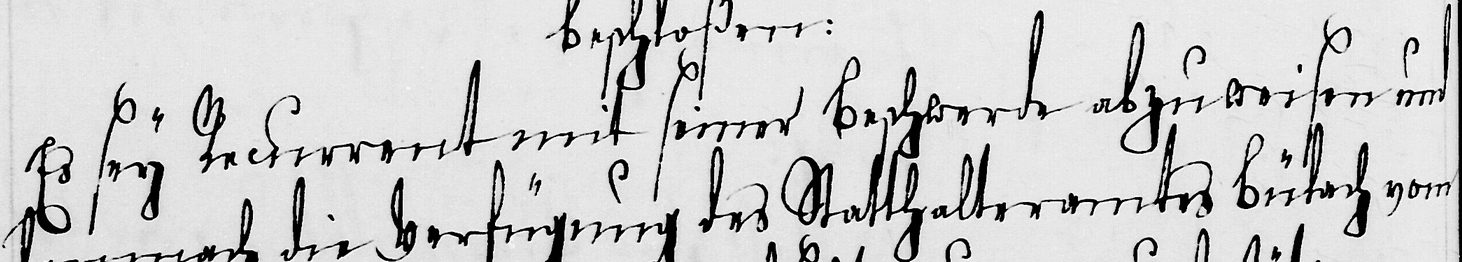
Es sey Recurrent mit seiner Beschwerde abzuweisen und
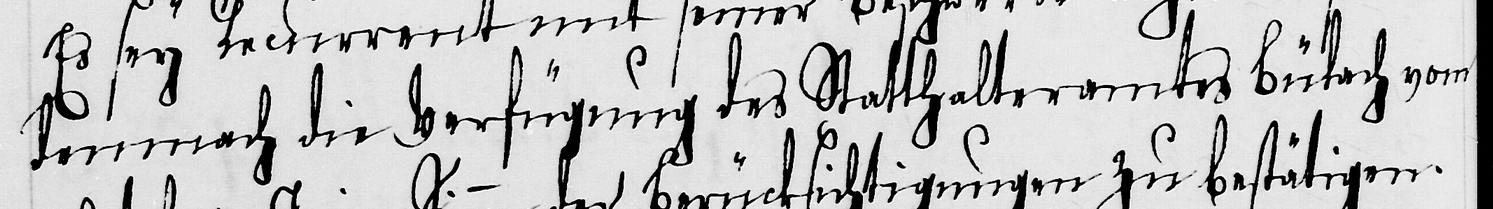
demnach die Verfügung des Statthalteramtes Bülach vom
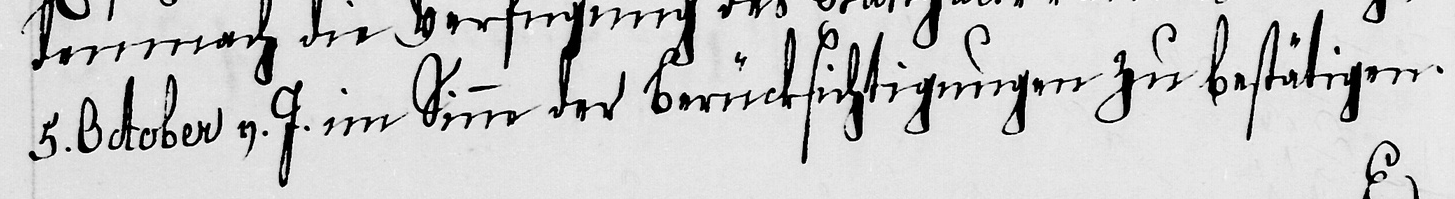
5. October v. J. im Sinne der Berücksichtigungen zu bestätigen.
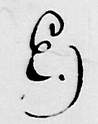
b¬
